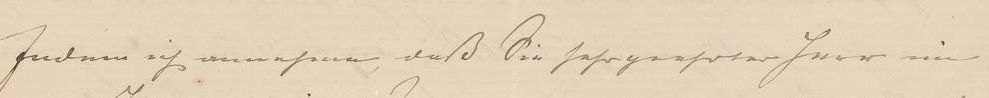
Indem ich annehme, daß Sie sehr geehrter Herr im
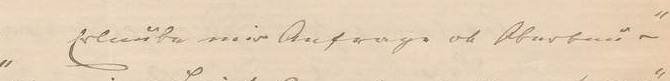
«Erlaube mir Anfrage ob Oberbau-
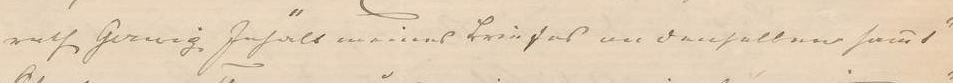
rath Gerwig Inhalt meines Briefes an denselben sammt
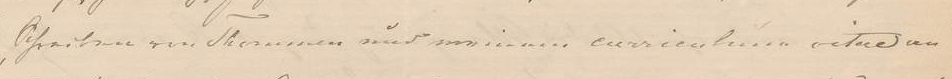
Schreiben von Thommen und meinen curriculum vitae an
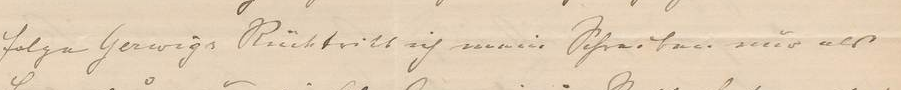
folge Gerwigs Rücktritt ich mein Schreiben nur als
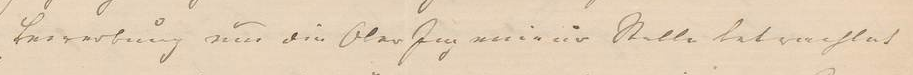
Bewerbung um die Ober Ingenieur Stelle betrachtet
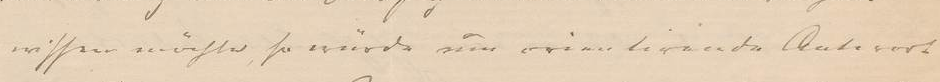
wissen möchte, so würde um orientirende Antwort
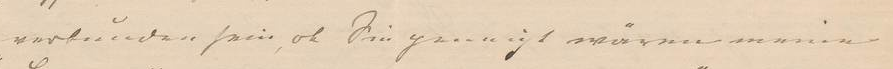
verbunden sein, ob Sie geneigt wären meine
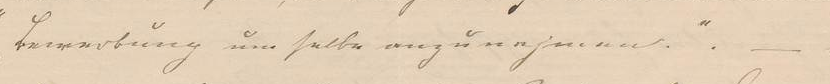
Bewerbung um selbe anzunehmen.». –
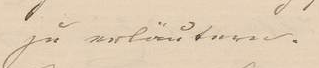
zu erläutern.
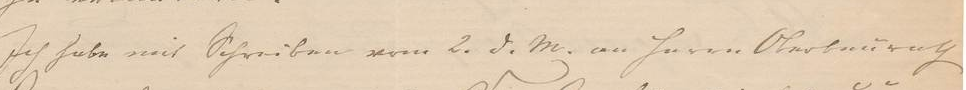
Ich habe mit Schreiben vom 2.d. M. an Herrn Oberbaurath
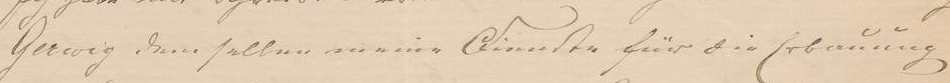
Gerwig demselben meine Dienste für die Erbauung
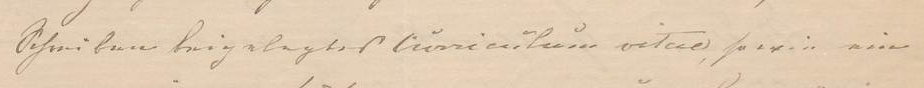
Schreiben beigelegtes Curriculum vitae, sowie ein
